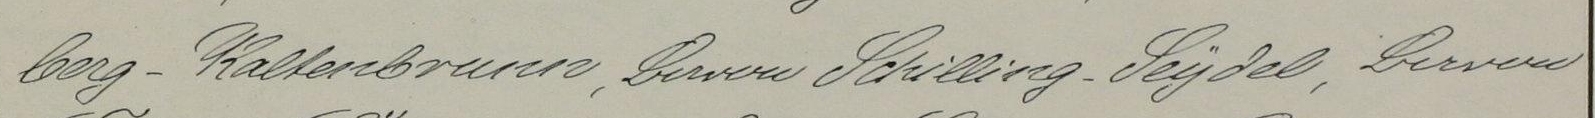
berg-Kaltenbrunn, Baron Schilling-Seydel, Baron
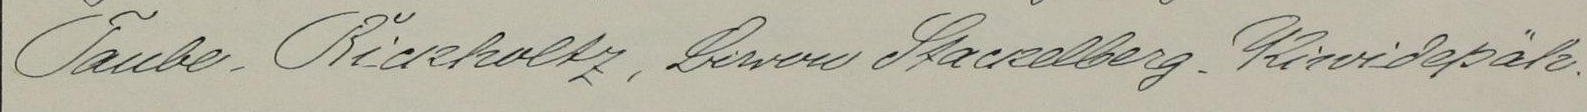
Taube-Rickholtz, Baron Stackelberg-Kiwidepäh.
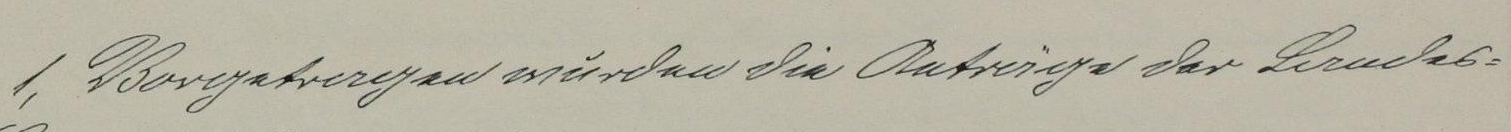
1. Vorgetragen wurden die Anträge der Landes-
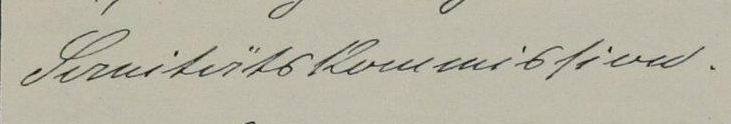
Sanitätskommission.
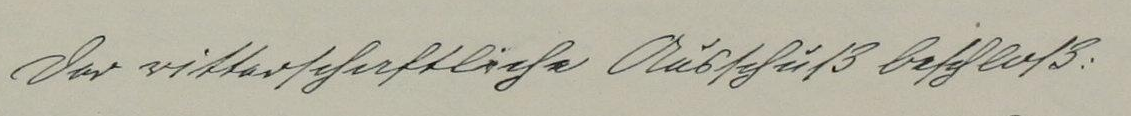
Der ritterschaftliche Ausschuß beschloß:
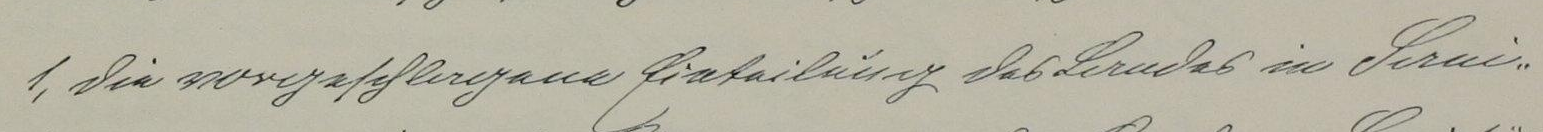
1. die vorgeschlagene Einteilung des Landes in Sani-
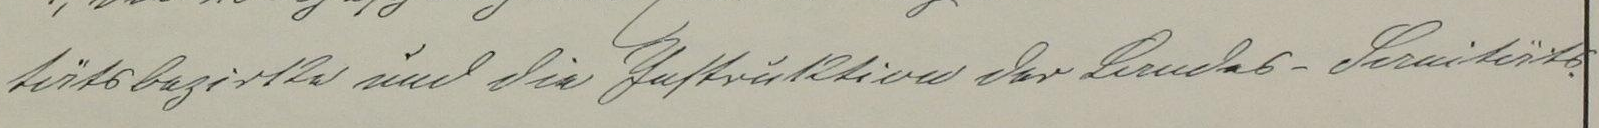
tätsbezirke und die Instruktion der Landes-Sanitäts-
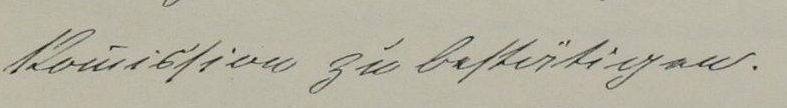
kommission zu bestätigen.
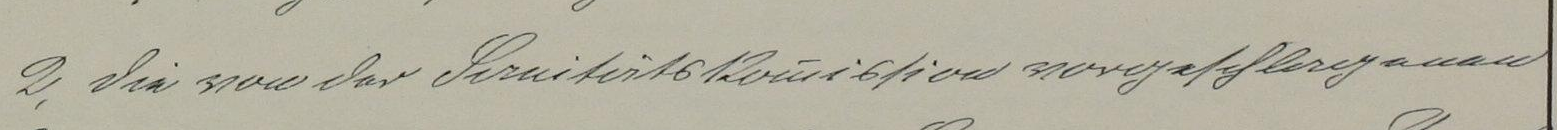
2. die von der Sanitätskommission vorgeschlagenen
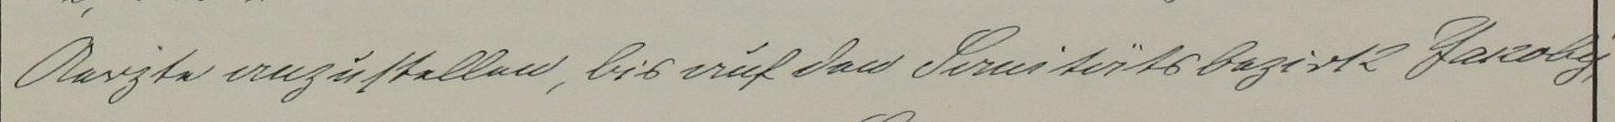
Aerzte anzustellen, bis auf den Sanitätsbezirk Jacoby,
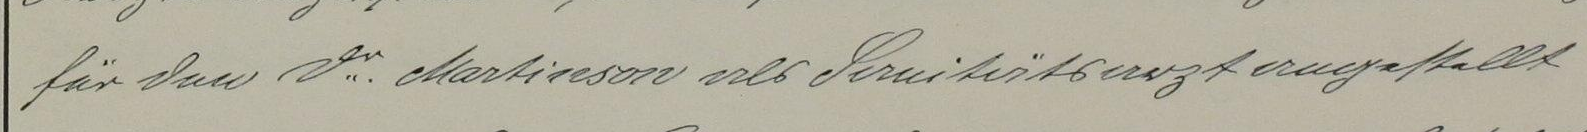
für den Dr. Martinson als Sanitätsarzt angestellt
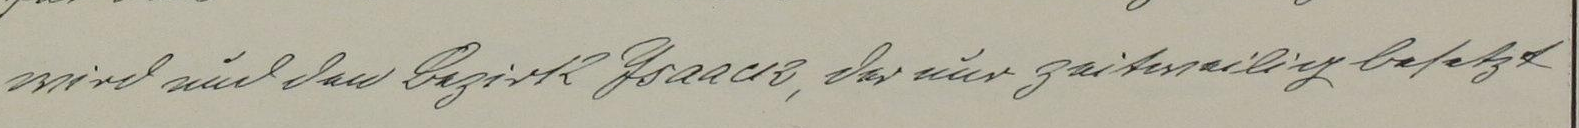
wird, und den Bezirk Isaack, der nur zeitweilig besetzt
